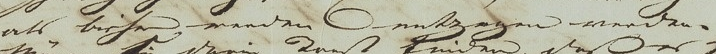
als bisher werden entzogen werden.
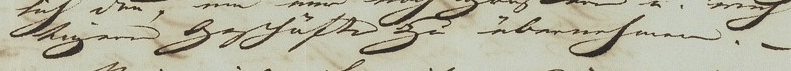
tigere Geschäfte zu übernehmen. –
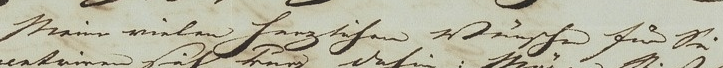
Meine vielen herzlichen Wünsche für Sie
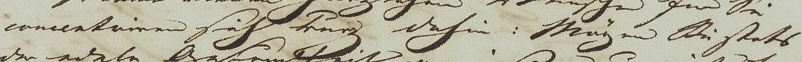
concentriren sich kurz dahin: Mögen Sie stets
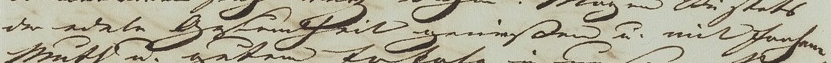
der edeln Gesundheit genießen u. mit frohem
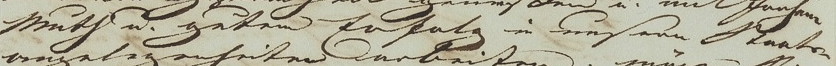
Muth u. gutem Erfolg in unsern Staats-
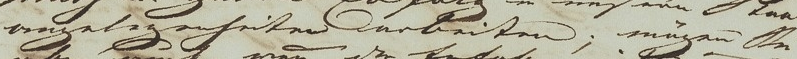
angelegenheiten arbeiten; mögen Sie
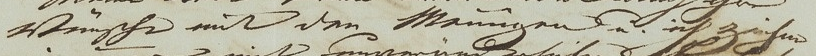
Wünsche mit den Meinigen u. ich zeichne
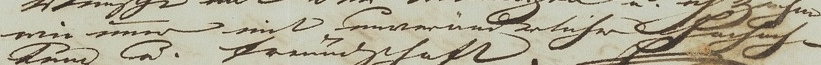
wie immer mit unveränderlicher Hochach-
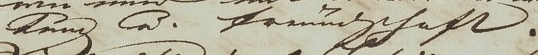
tung u. Freundschaft.
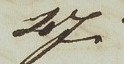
47.
